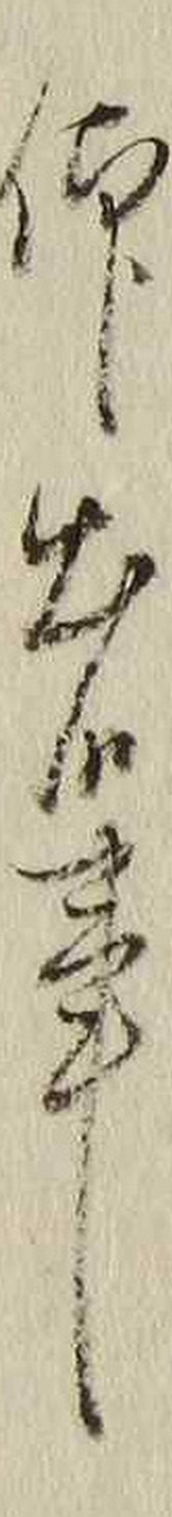仰付候事
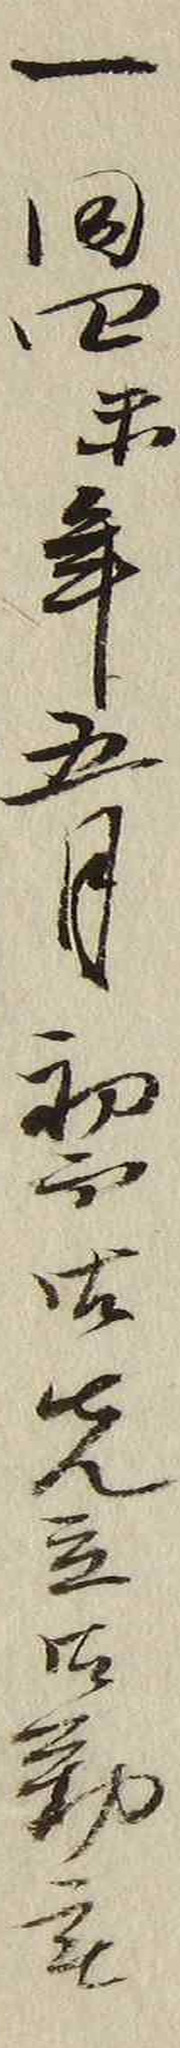一同四未年五月初而御先立御勤被

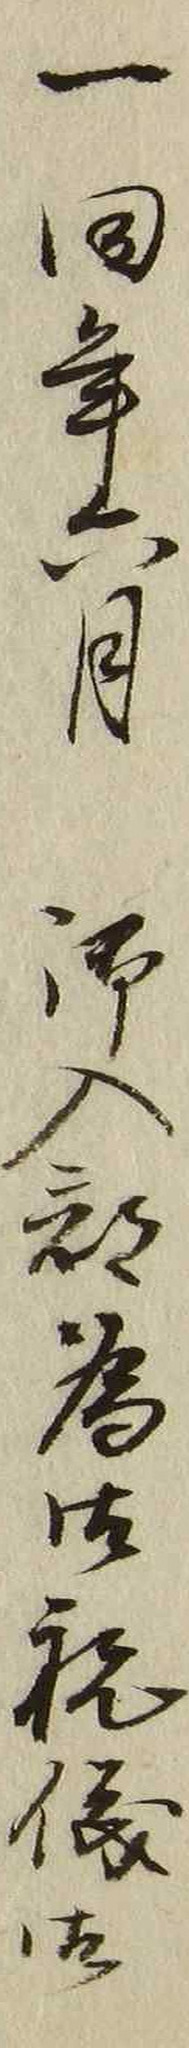一同年六月御入部為御祝儀御
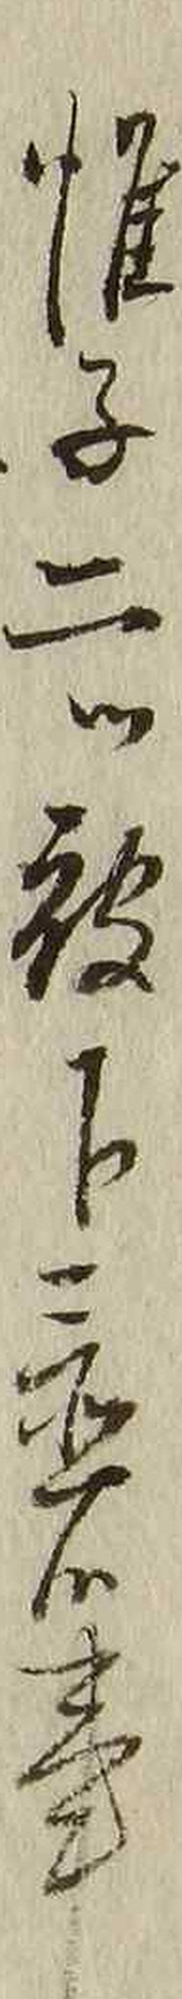唯子二ツ被下置候事
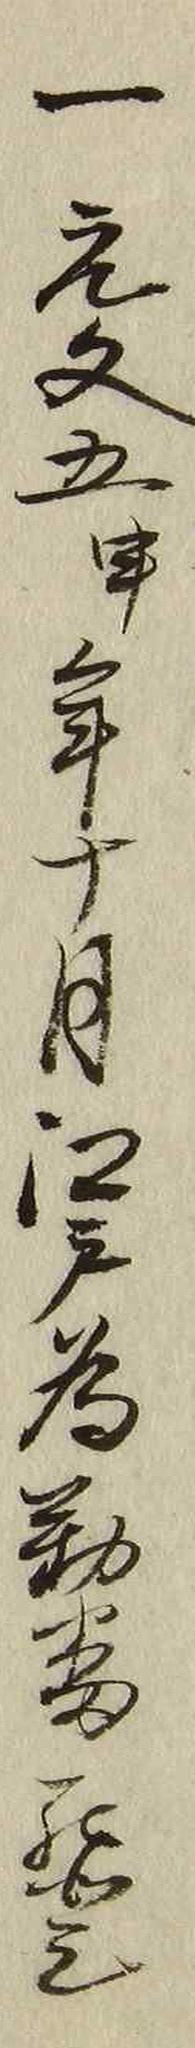一元文五申年十月江戸為勤番罷登
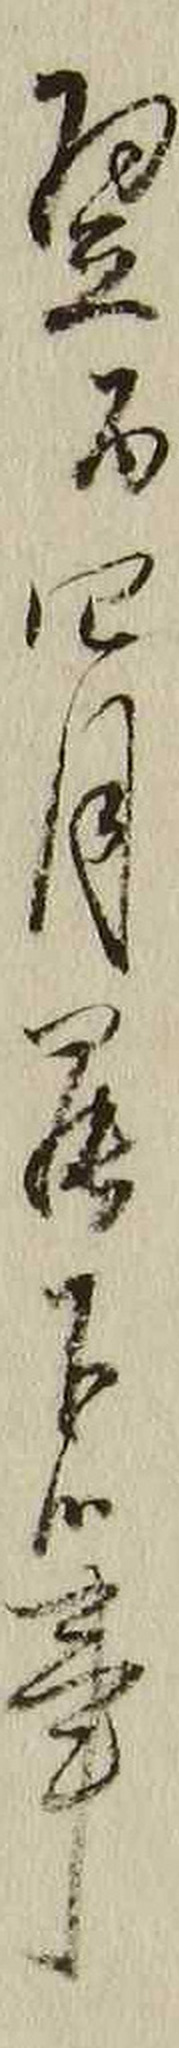翌酉四月罷下候事
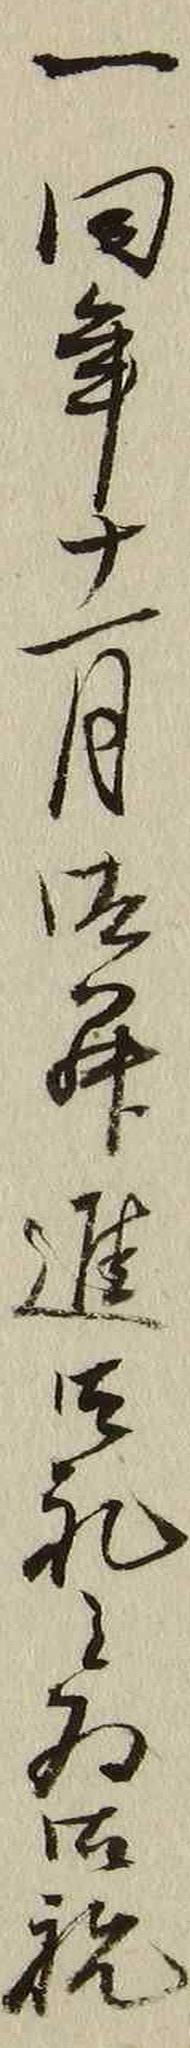一同年十一月御昇進御礼之為御祝
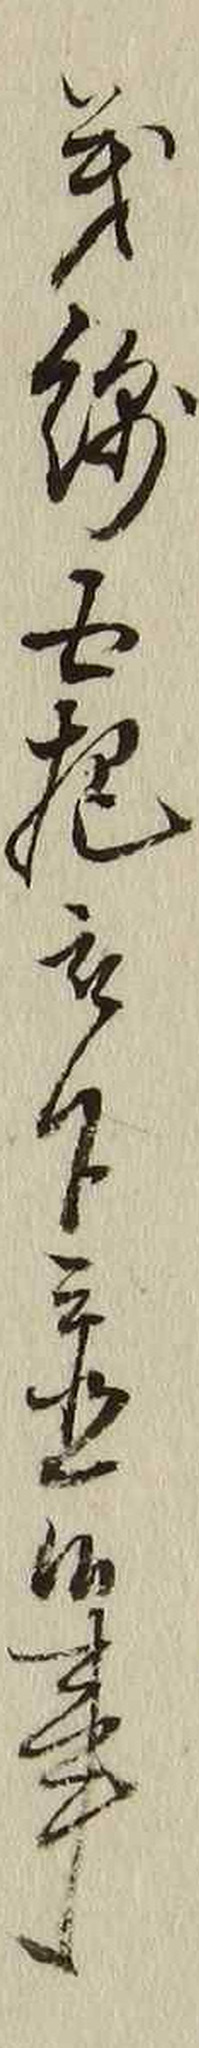義綿五把被下置候事
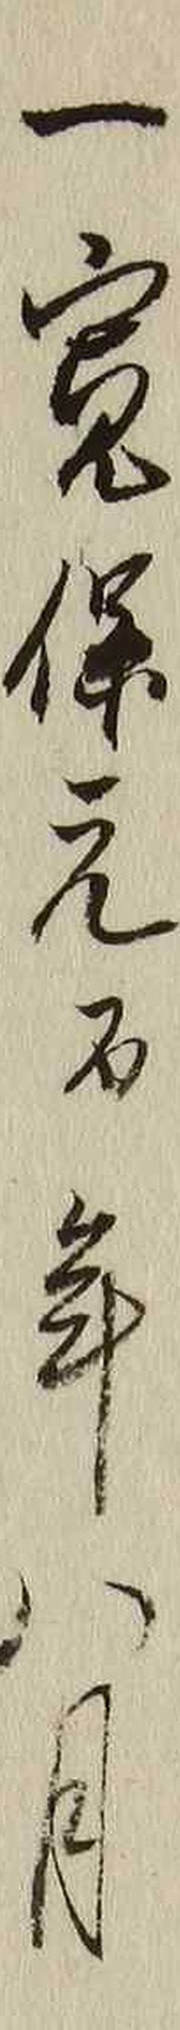一寛保元酉年八月
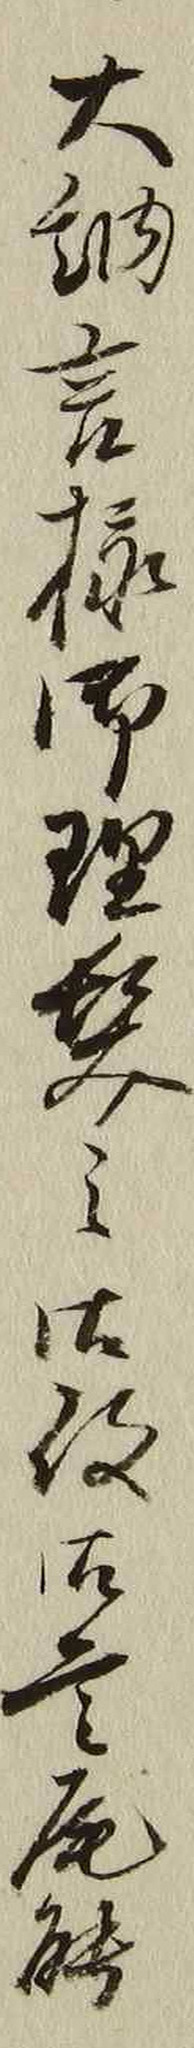大納言様御理髪之御役御首尾能
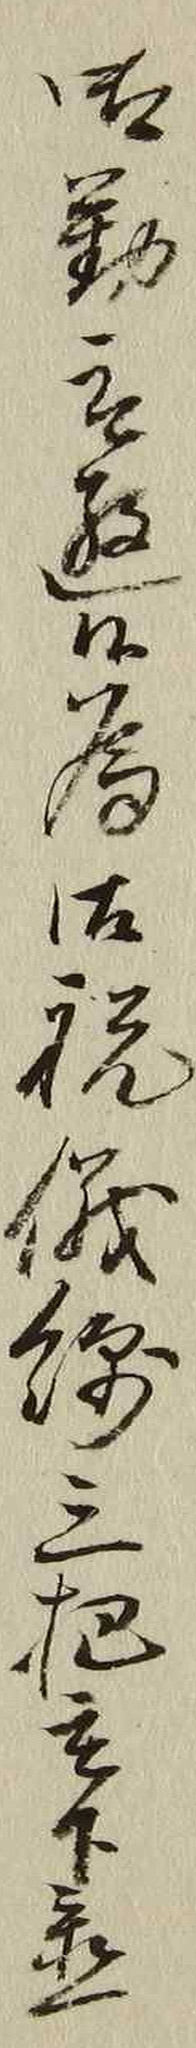御勤被遊候為御祝儀綿三把被下置
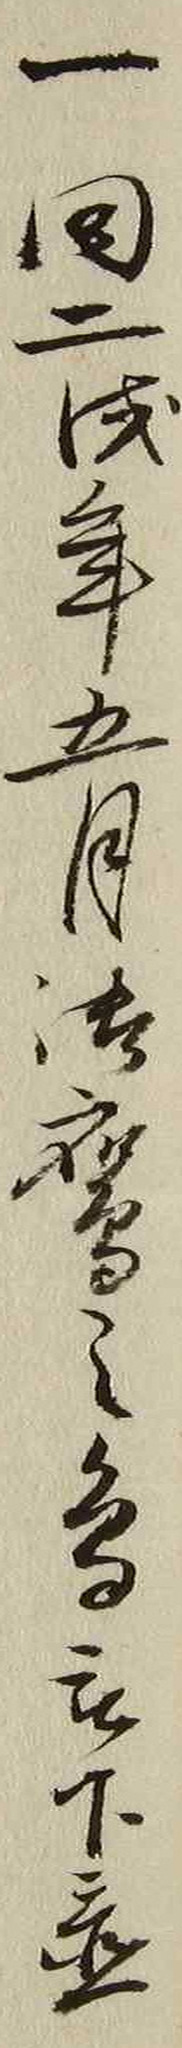一同二戌年五月御鷹之鳥被下置
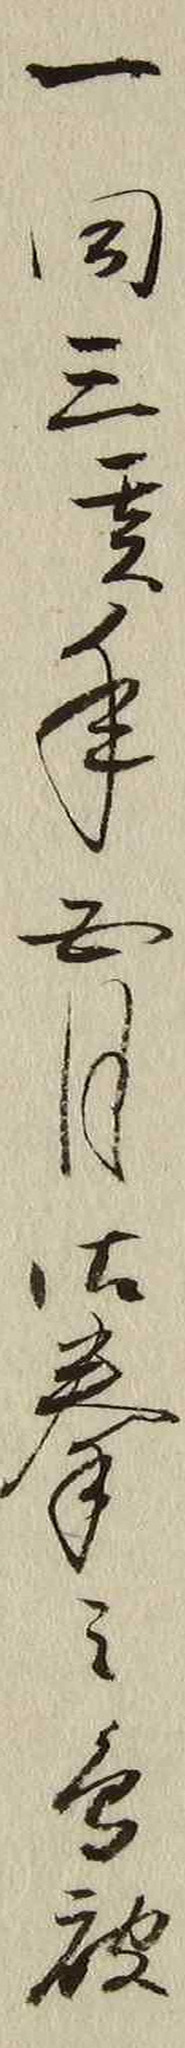一同三亥年五月御拳之鳥被
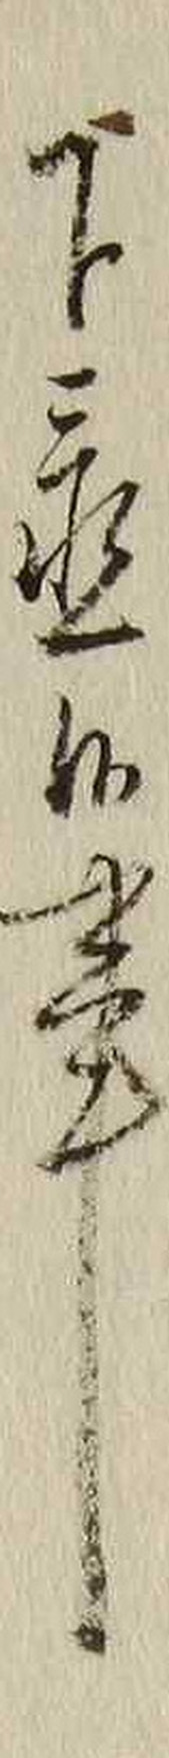下置候事
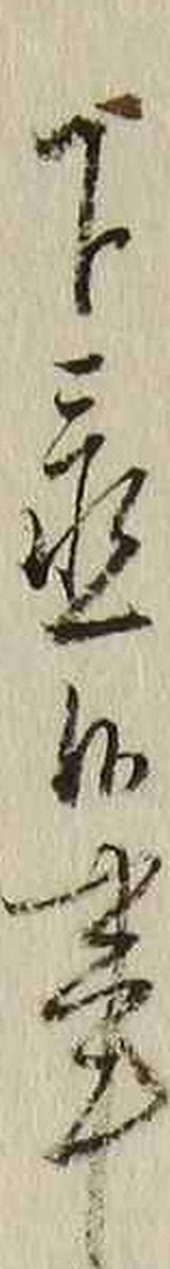下置候事
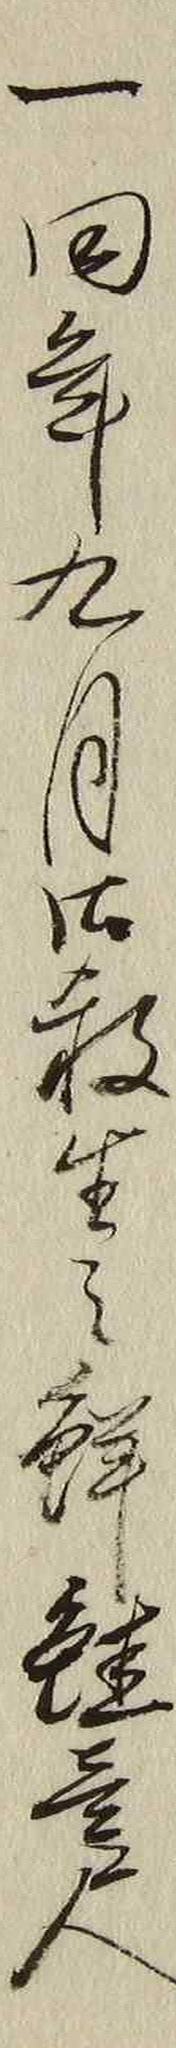一同年九月御殺生之鮮鮭壱尺
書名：諸士系譜　巻之351　す之部1
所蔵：会津若松市立会津図書館
